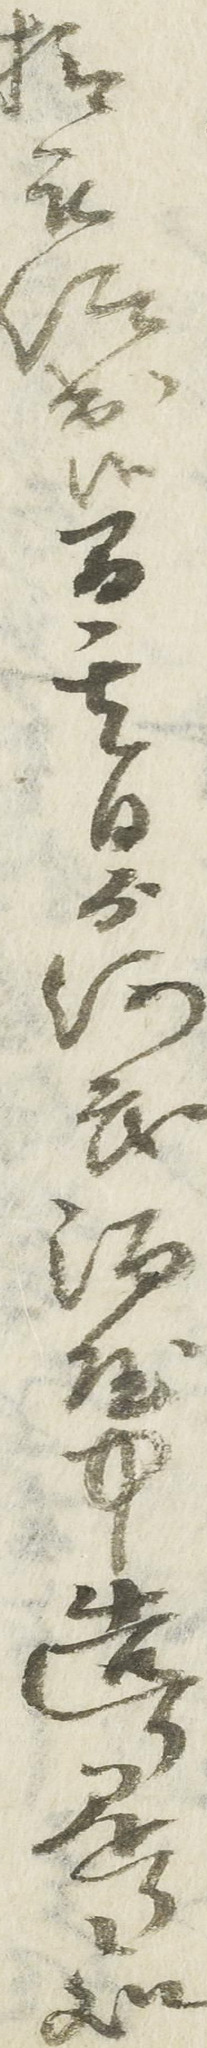様被仰出候間其日ゟ何も酒屋中造り懸り候処
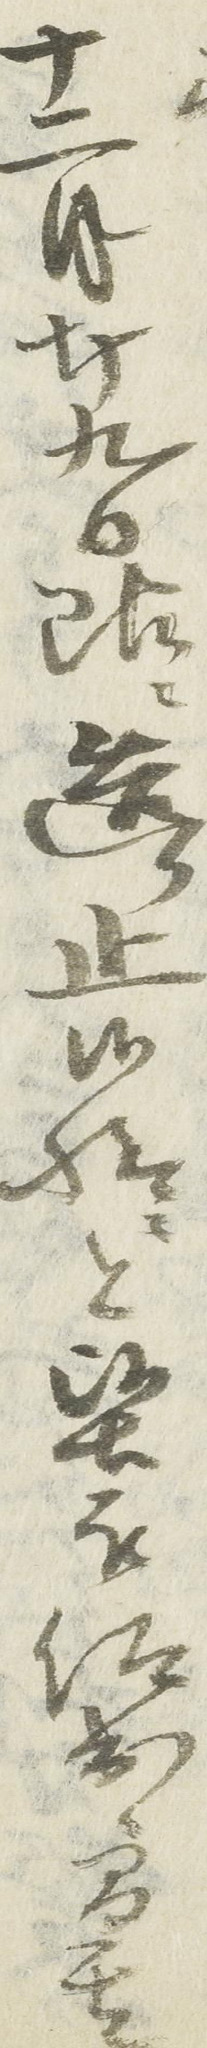十二月廿九日限ニ造り止候様ニと堅被仰出候間其
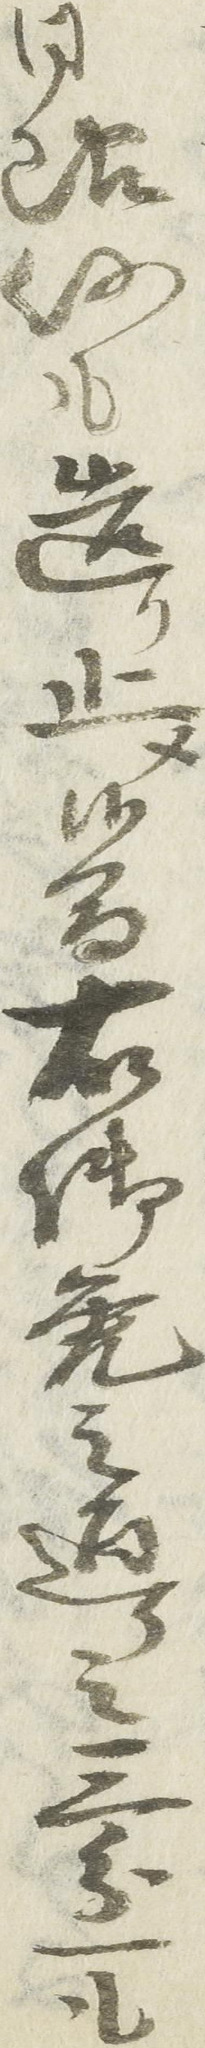日限何も造り止メ候間右御免の通り之三分一も
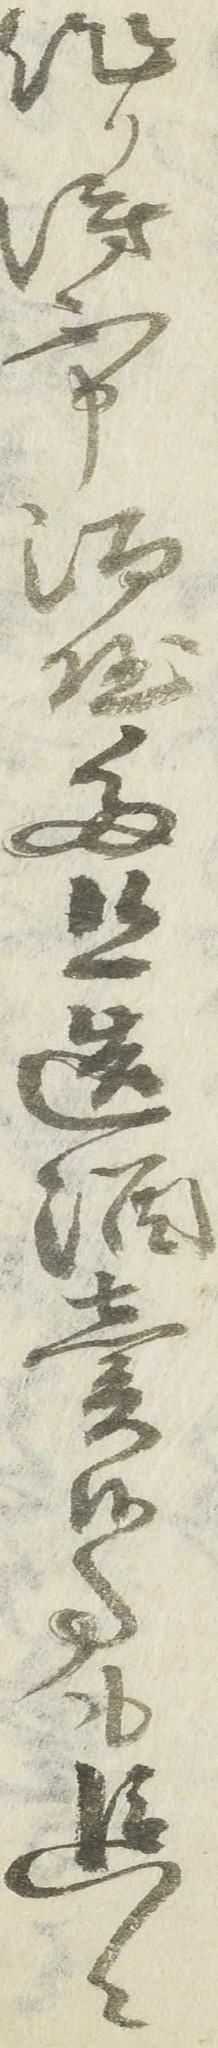作り得不申酒屋多且造酒売候事も追々
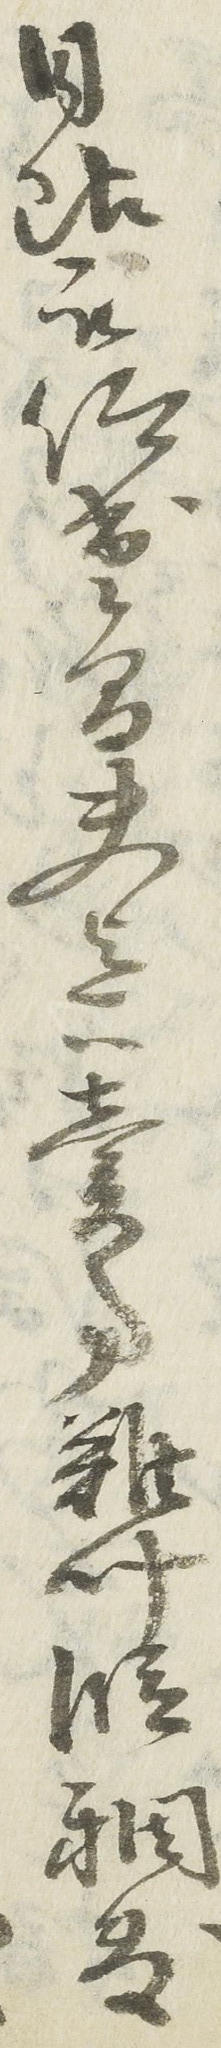日限被仰出候間夫迄は売事難叶段稠敷
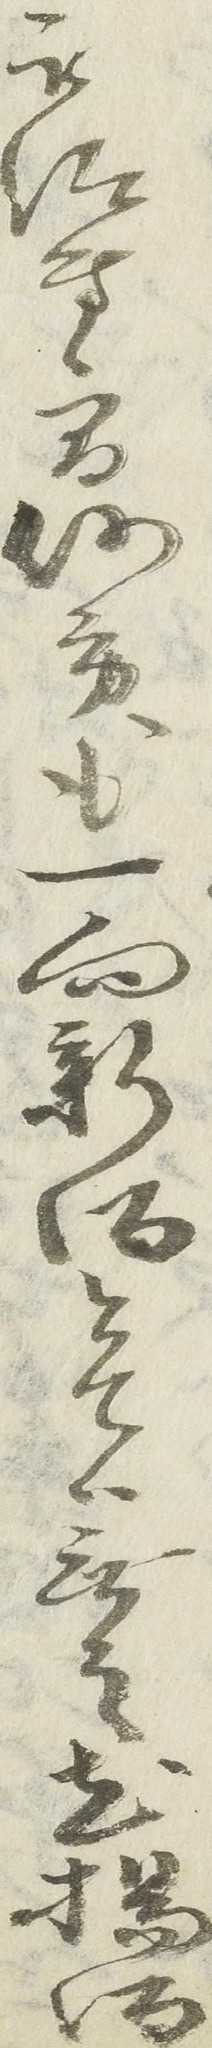被仰付候間何方へも一向新酒とては無之尤揚酒
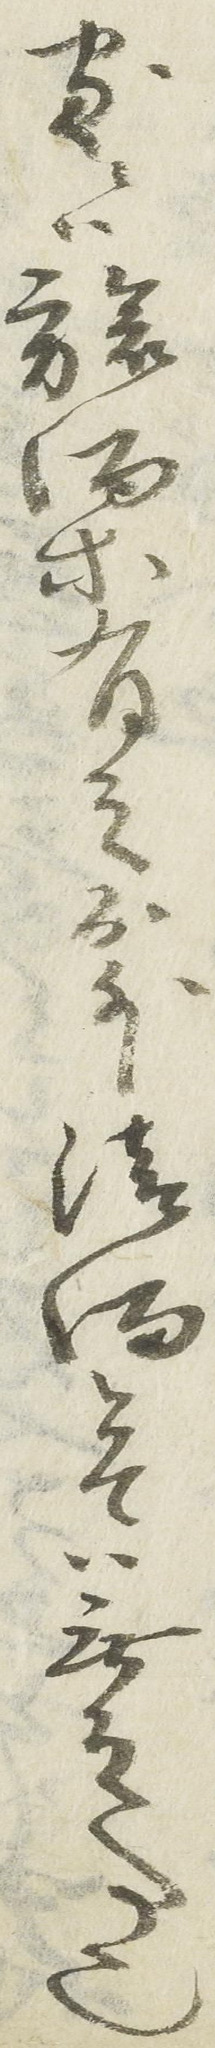家二は旅酒等有之分外清酒とては無之事也
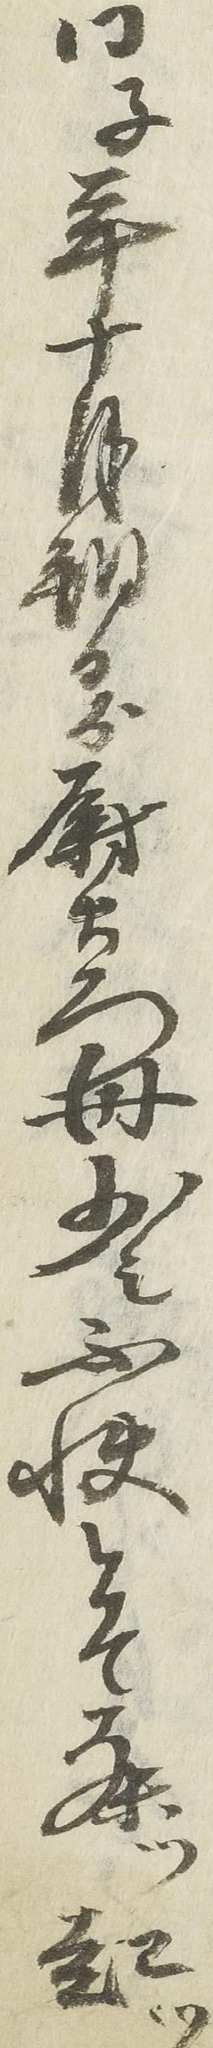一同子年十月朔日ゟ厨右衛門母少し不快とて寐ツ起ツ

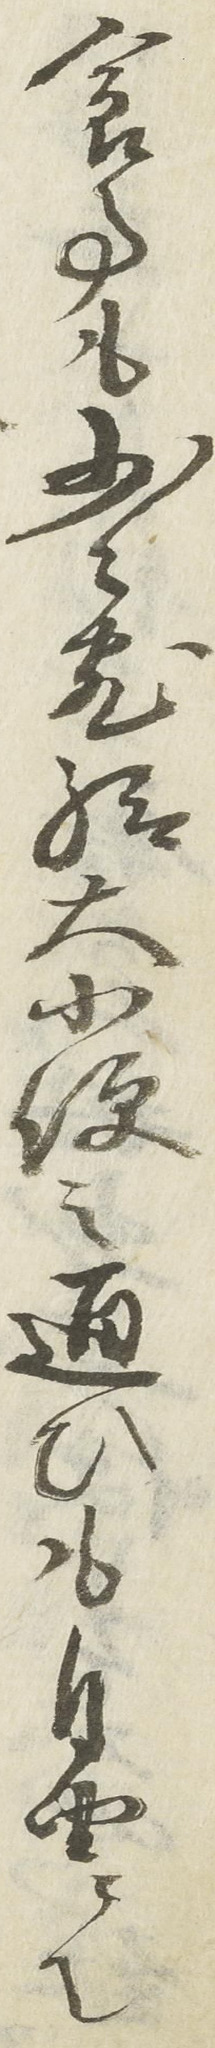食事も少々宛給大小便の通ひも自由ニて
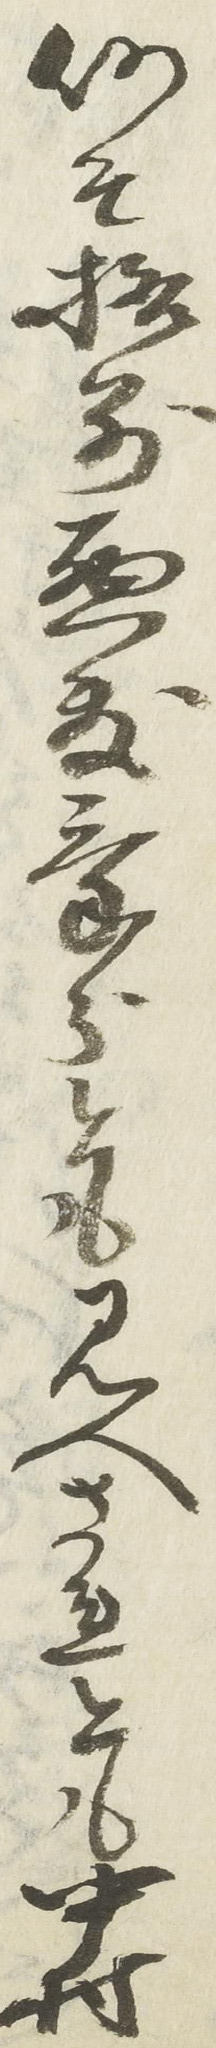何そ格別悪敷気分とも見へされとも中村
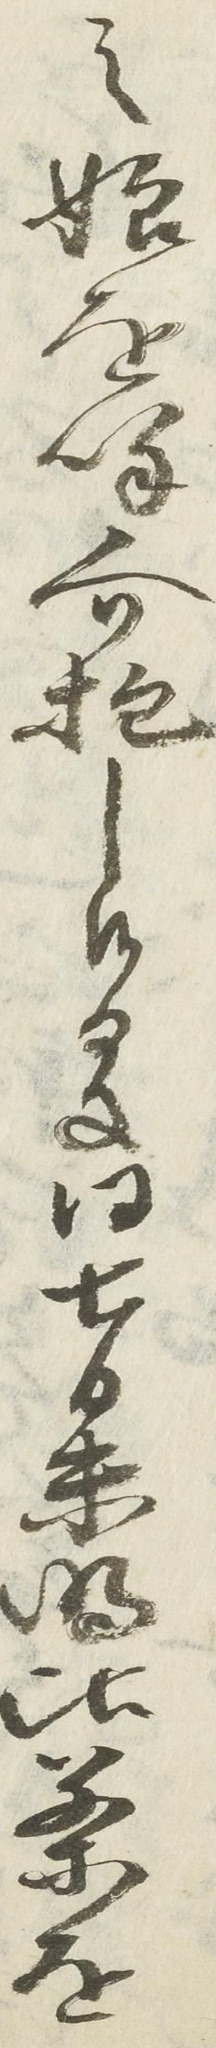之娘を呼介抱しけるに同七日未明比茶を
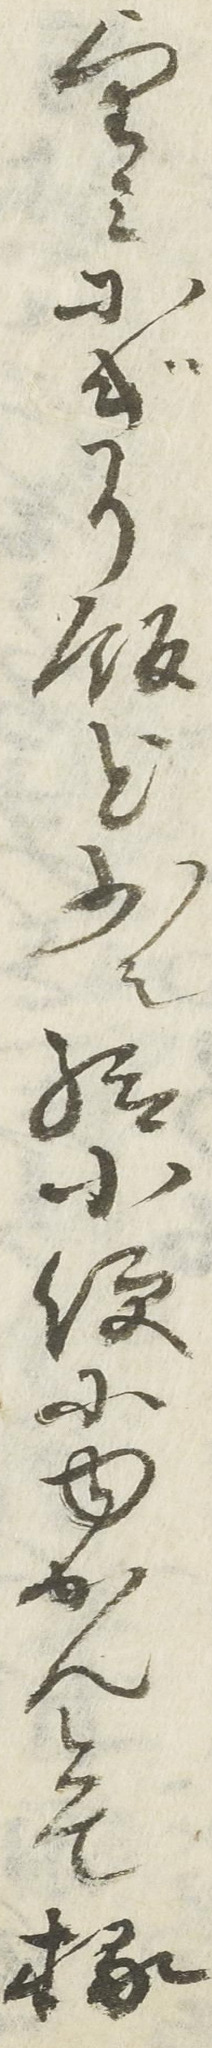望みにぎり飯を少シ給小便にゆかんとて縁
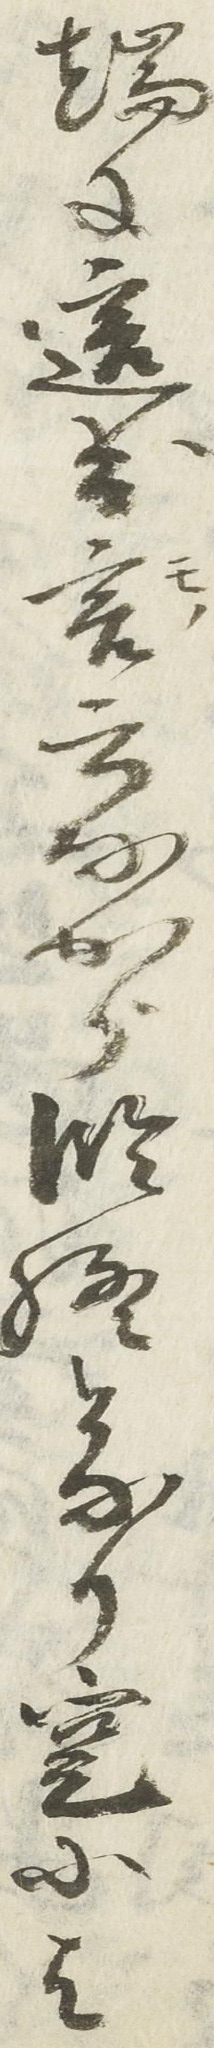端に這出言云なから臨終となり寔には
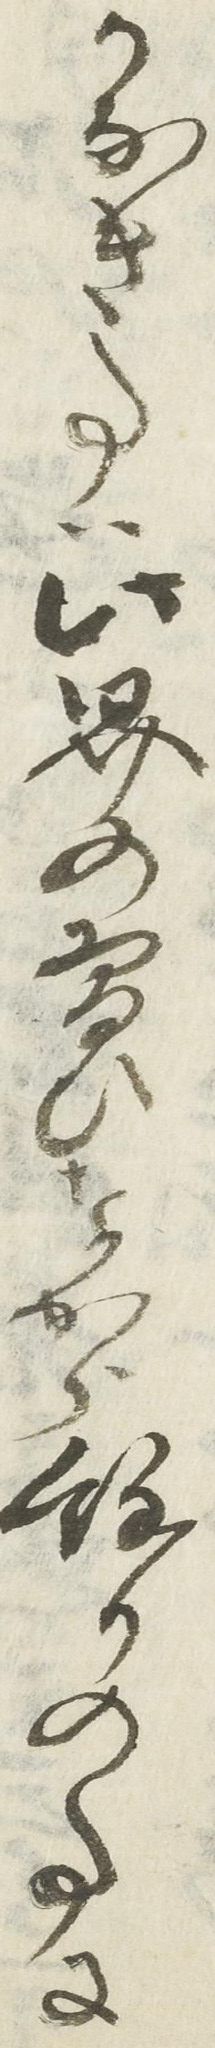かなき事は此界の習ひなから餘りの事に
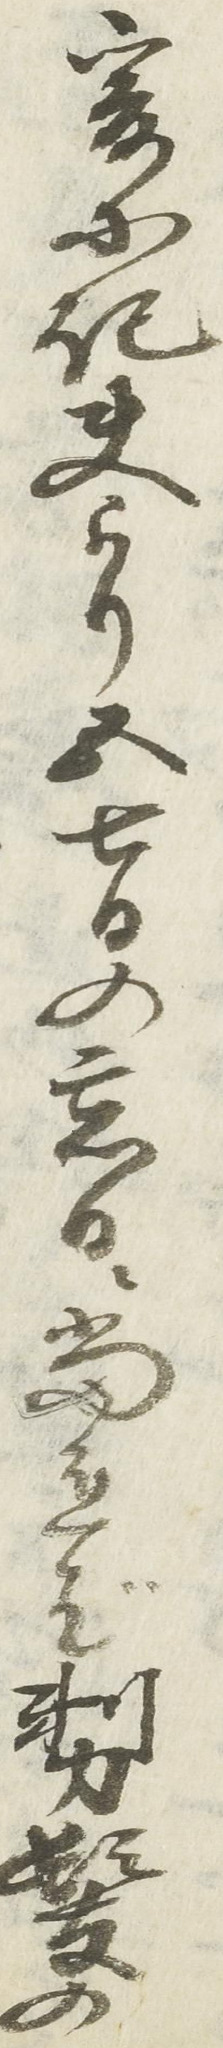爰に記夫より五七の忘日ニ当れぞ剃髪の
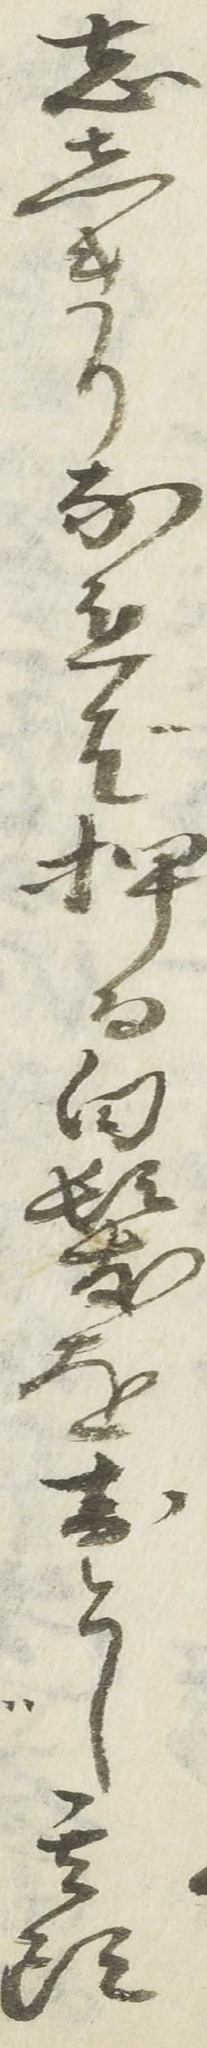志しきりなれぞ押而白髪をおとし其頭
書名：後見笑
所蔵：東京大学地震研究所図書室 Earthquake Research Institute Library, The University of Tokyo, JAPAN
